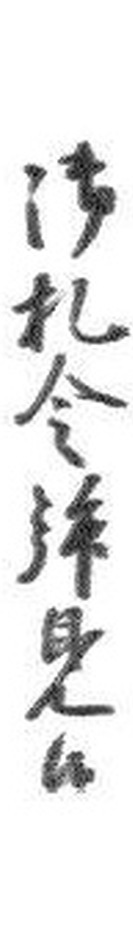御札令拝見候
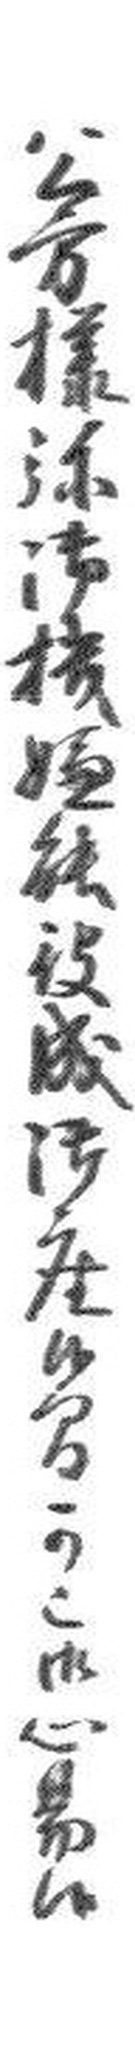公方様弥御機嫌能被成御座候間可被御心易候

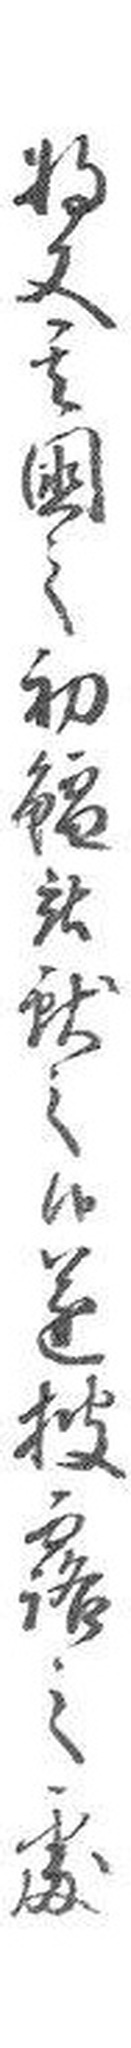将又其国之初鱈被献之候遂披露之処
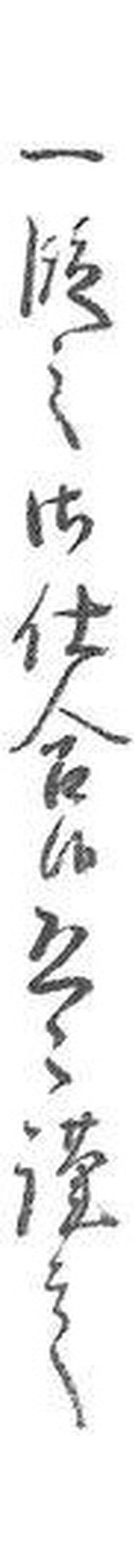一段之御仕合候恐々謹言
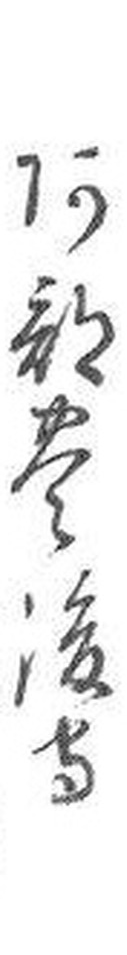阿部豊後守
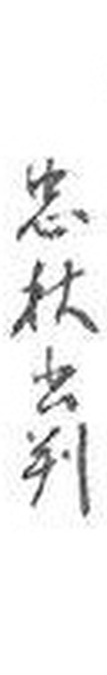忠清書判
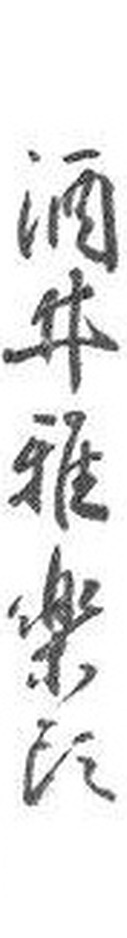酒井雅楽頭
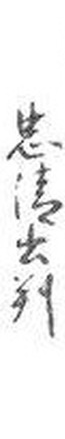忠清書判
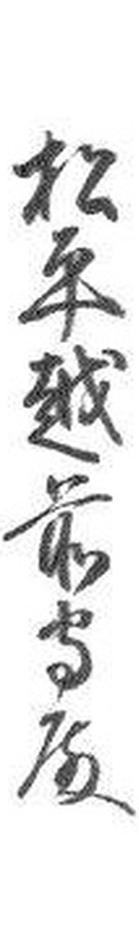松平越前守殿
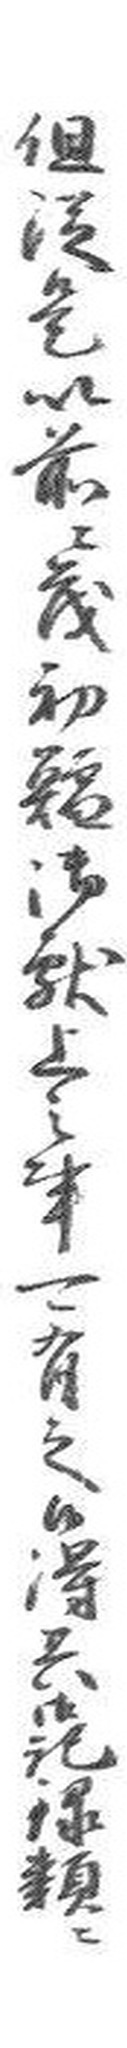但従是以前ニも初鱈御献上之事可有之候得共御記録類ニ
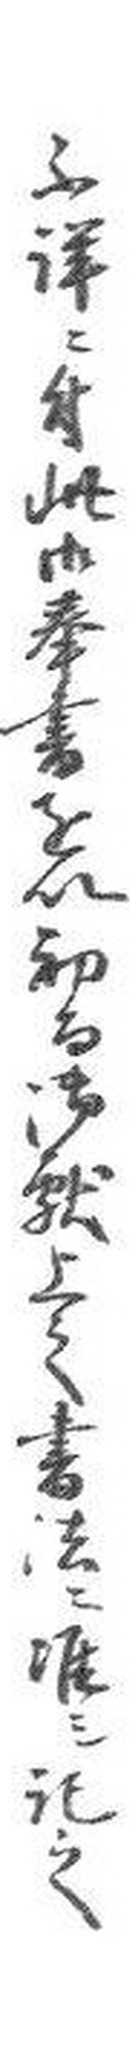不詳ニ付此御奉書を以初而御献上之書法ニ准シ記之
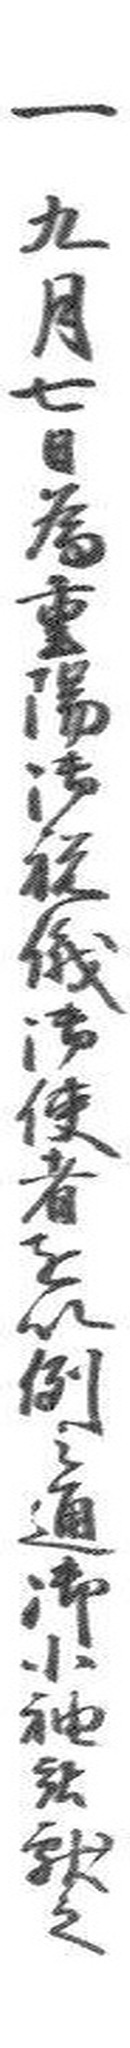一九月七日為重陽御祝儀御使者を以例之通御小袖被献之
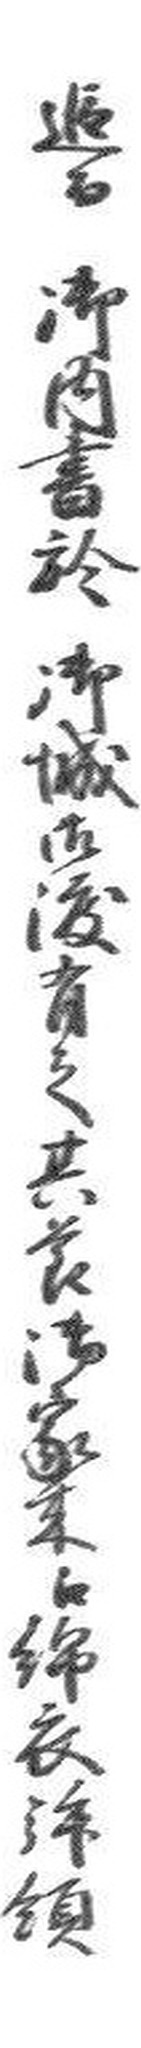追而御内書於御城御渡有之其節御家来江綿衣拝領
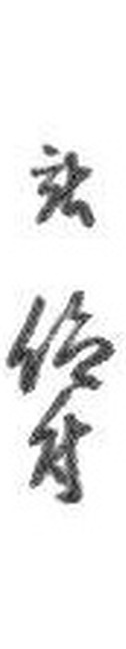被仰付
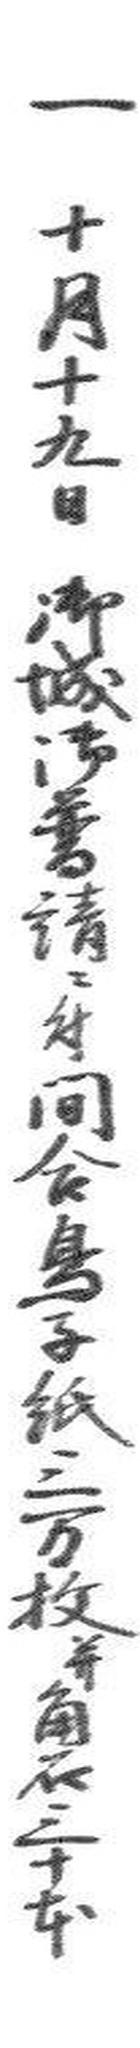一十月十九日御城御普請ニ付間合鳥子紙三万枚并角石三十本
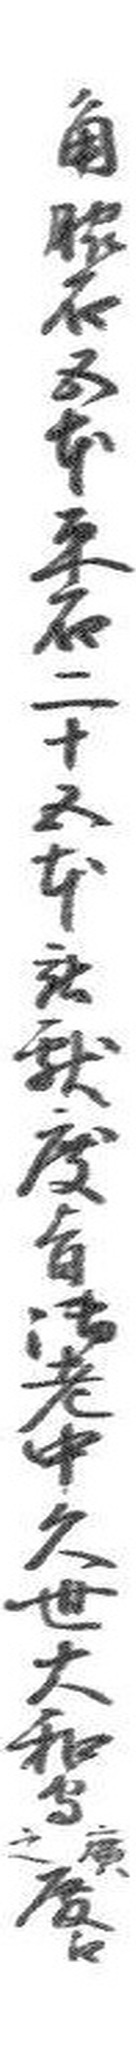角脇石五本平石二十五本被献度旨御老中久世大和守広之殿江
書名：家譜 五 光通公 従寛永十三年到万治二年
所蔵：福井県文書館 Fukui Prefectural Archives
